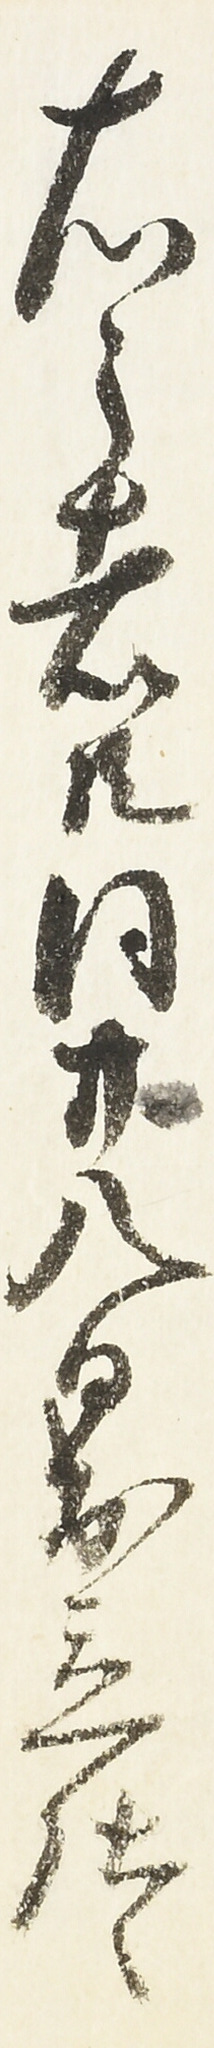右之者共同廿八日出立仕候
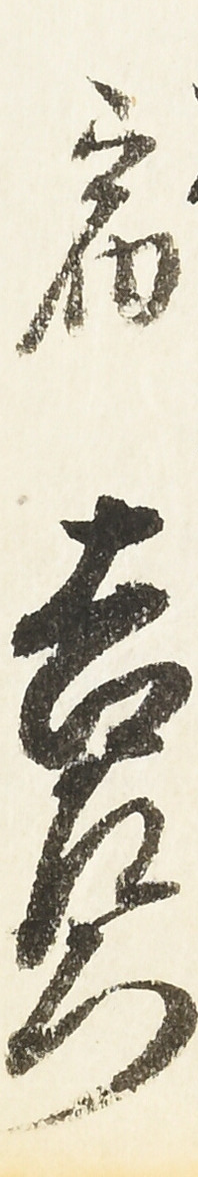宿吉左衛門
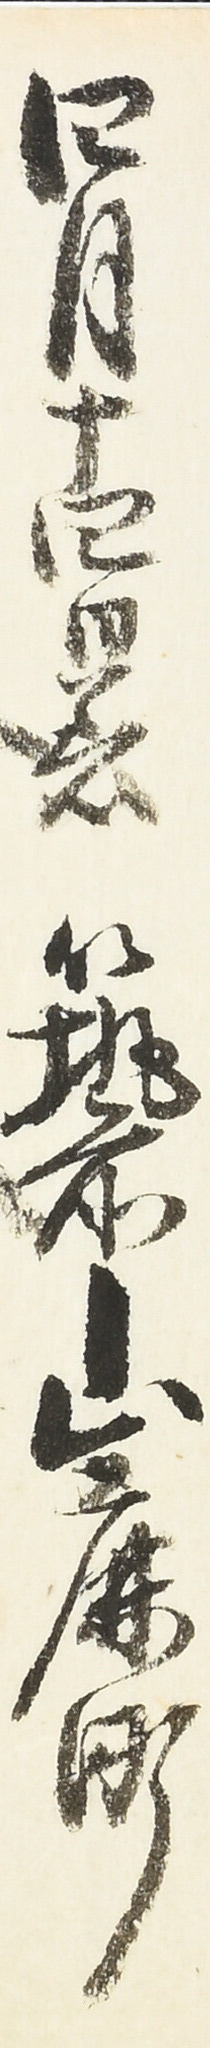四月十四日着筑前山鹿町
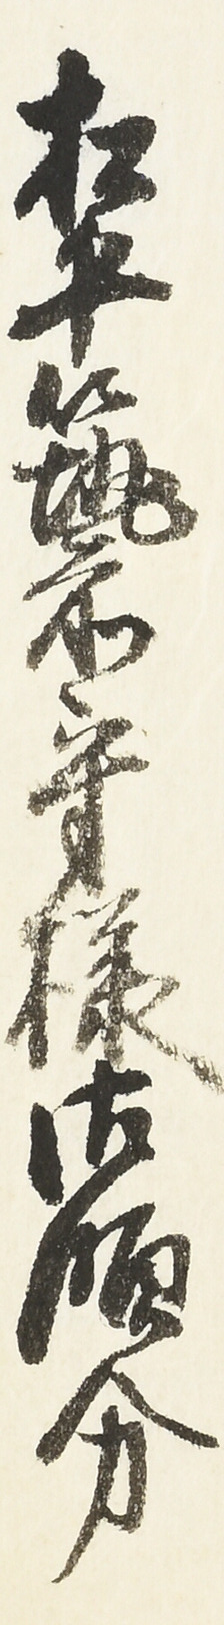松平筑前守様御領分
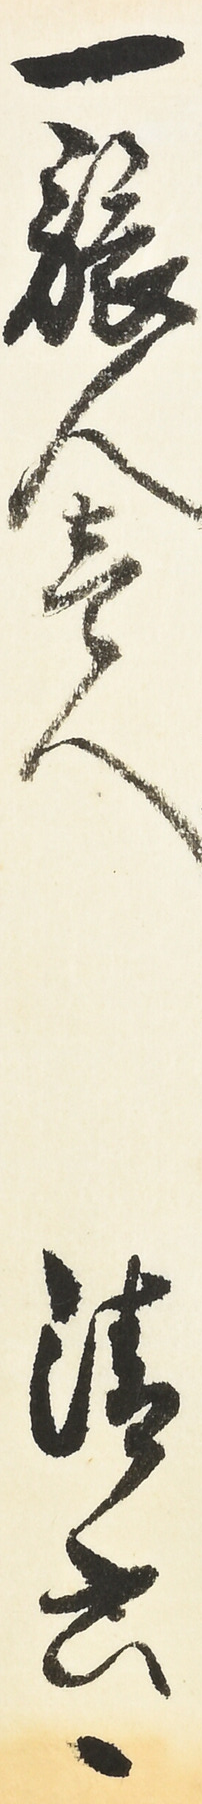一旅人壱人清六・
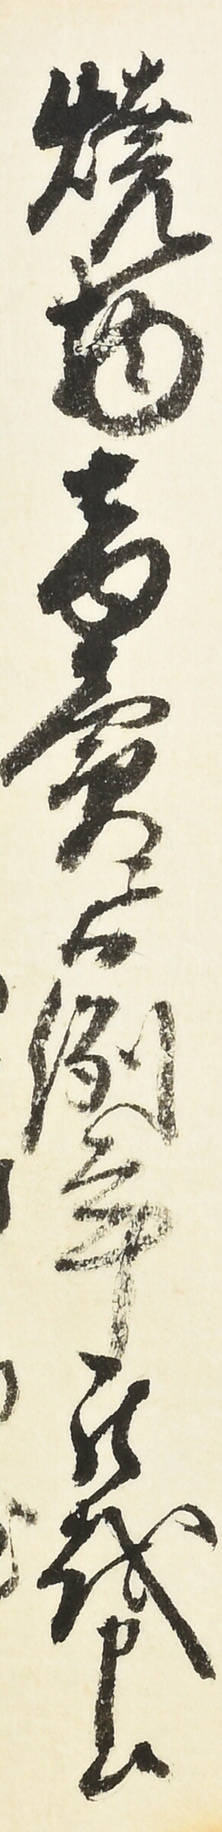焼物商売ニ而例年罷越申候
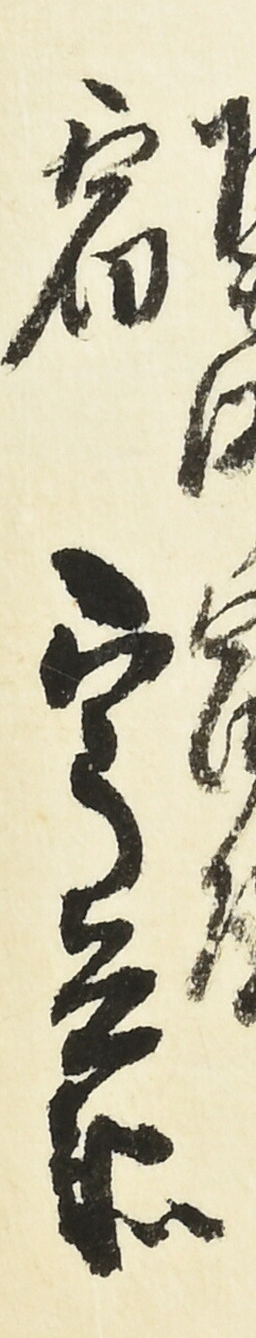宿宇兵衛
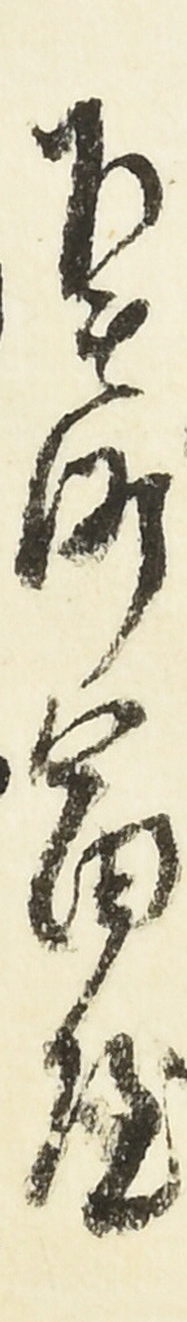下モ町冨屋
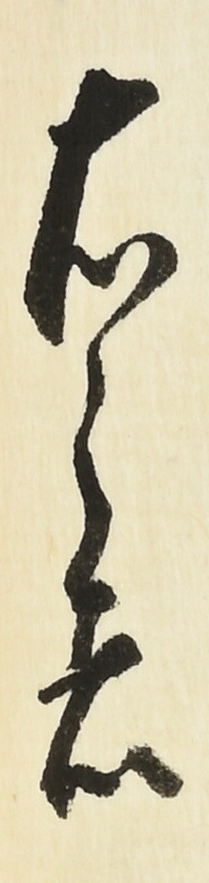右之者

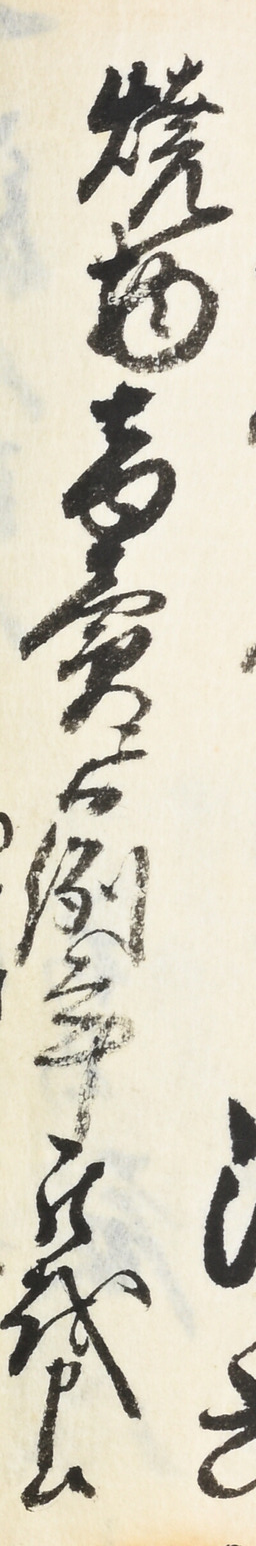夏物商売ニ而例年罷越申候
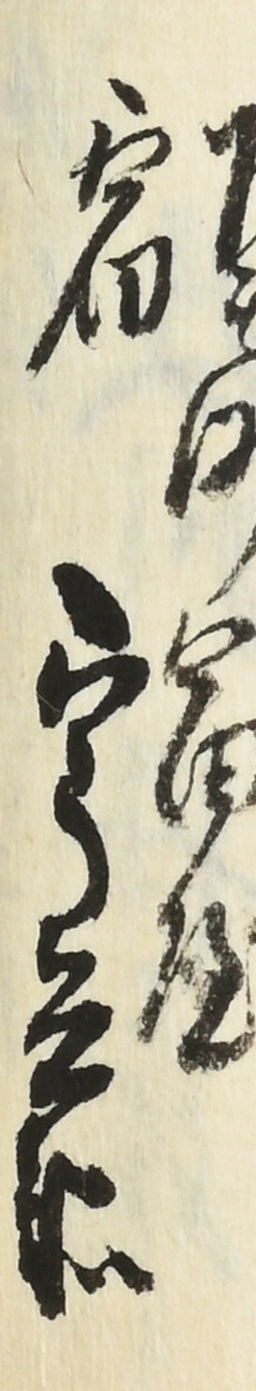宿久兵衛
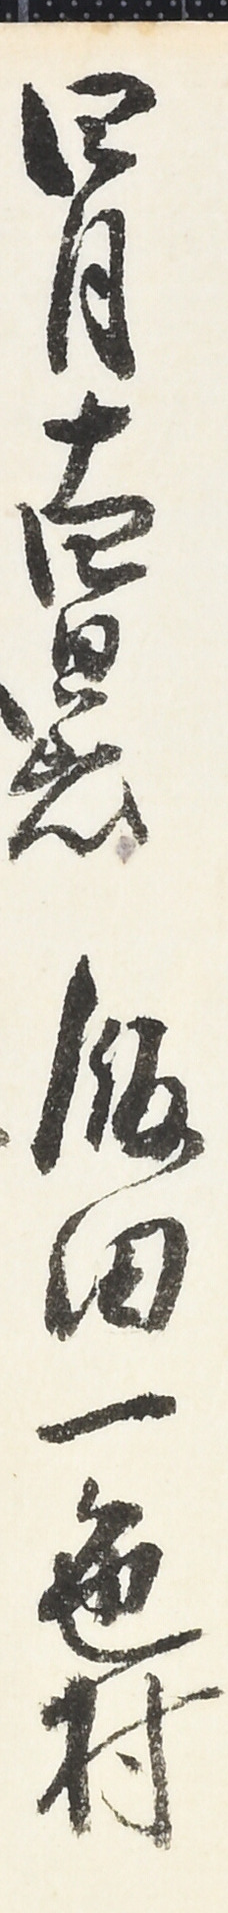四月十四日着飯田一色村
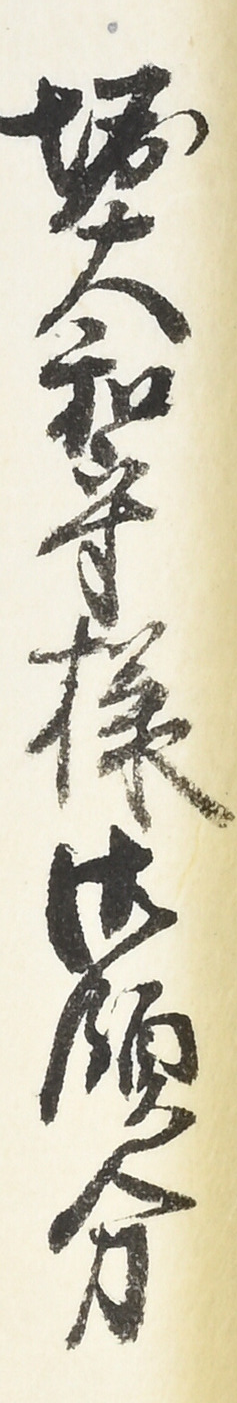堀大和守様御領分
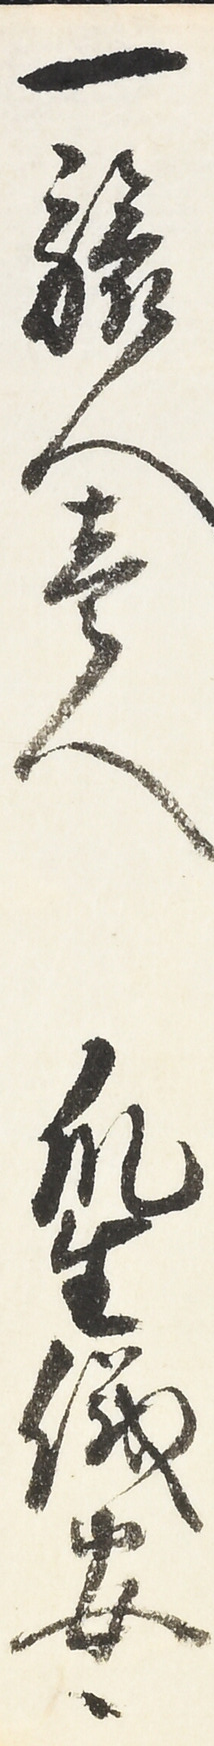一旅人壱人瓜生儀安・
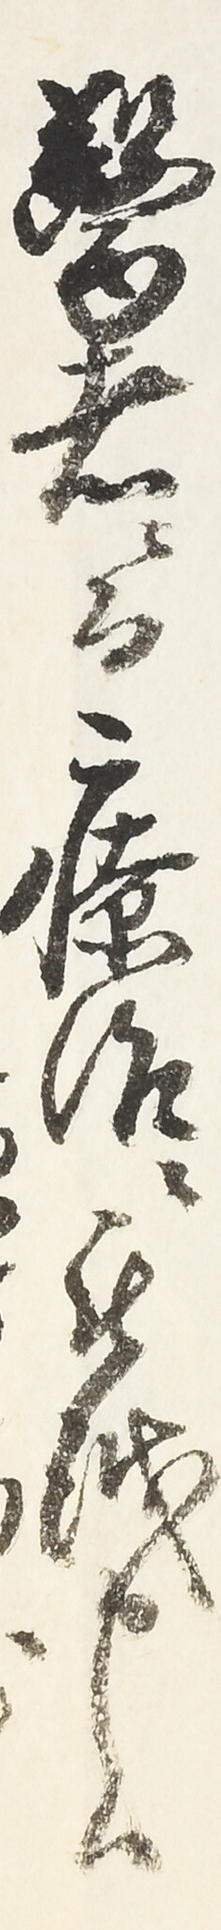医者ニ而療治ニ罷越申候
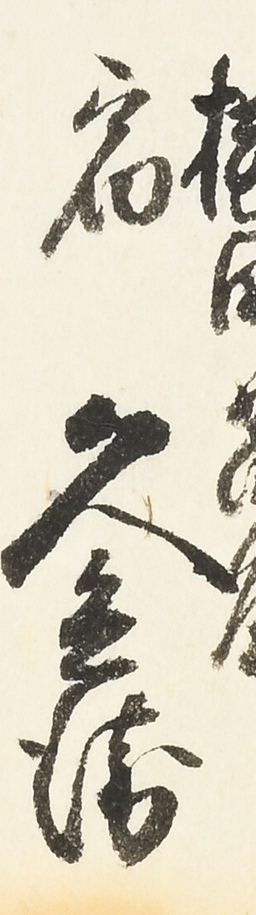宿久兵衛
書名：町中旅人泊控帳
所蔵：伊那市立高遠町図書館・合同会社AMANE
